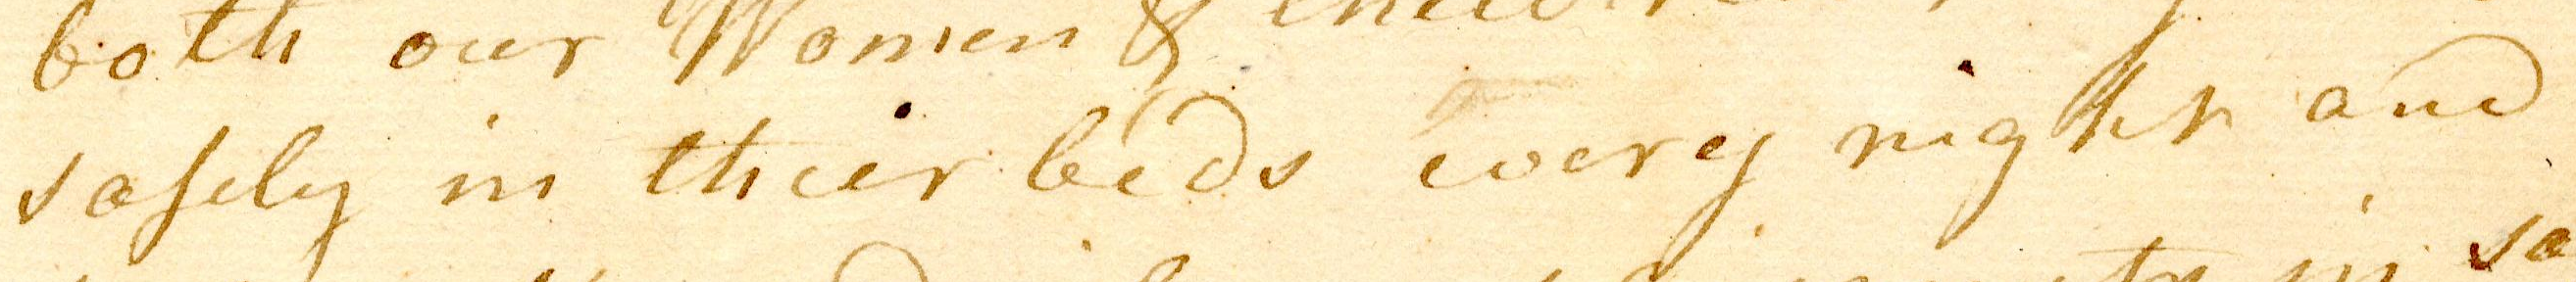safely in their beds every night and
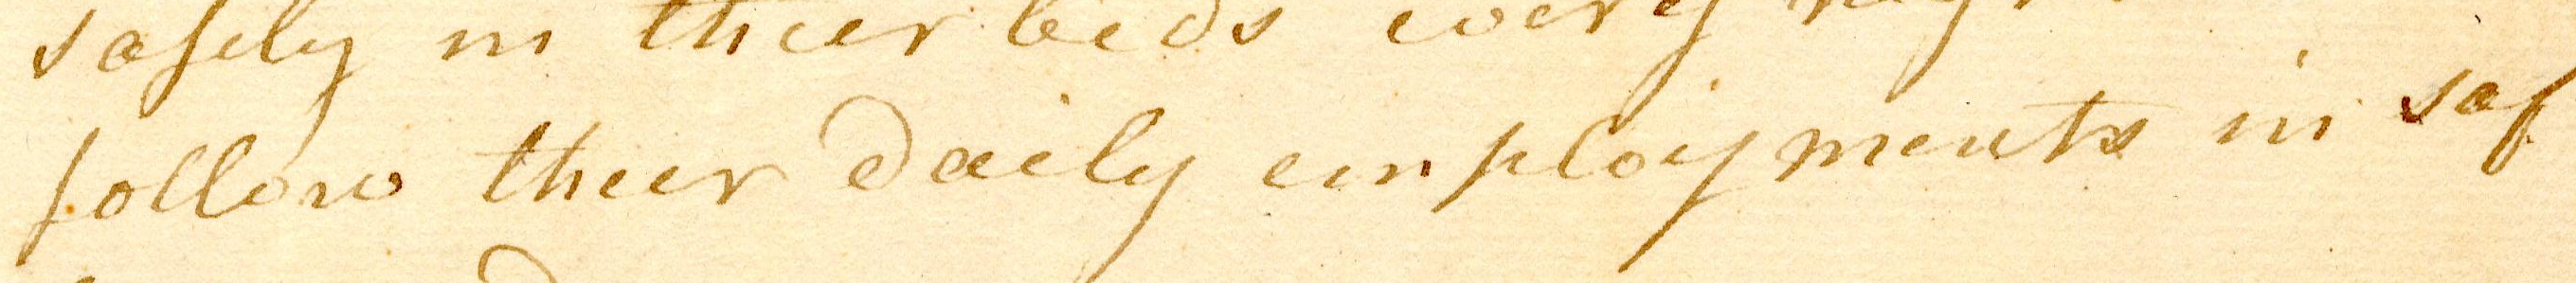follow their daily employments in saf
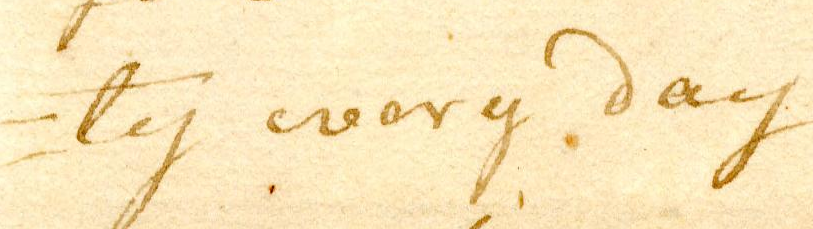-ty every day.
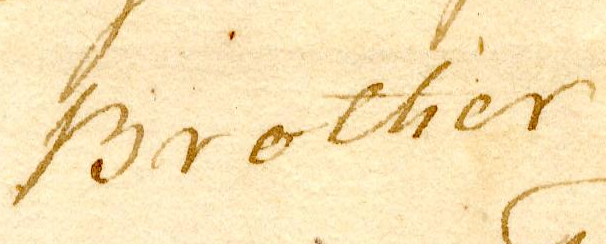Brother
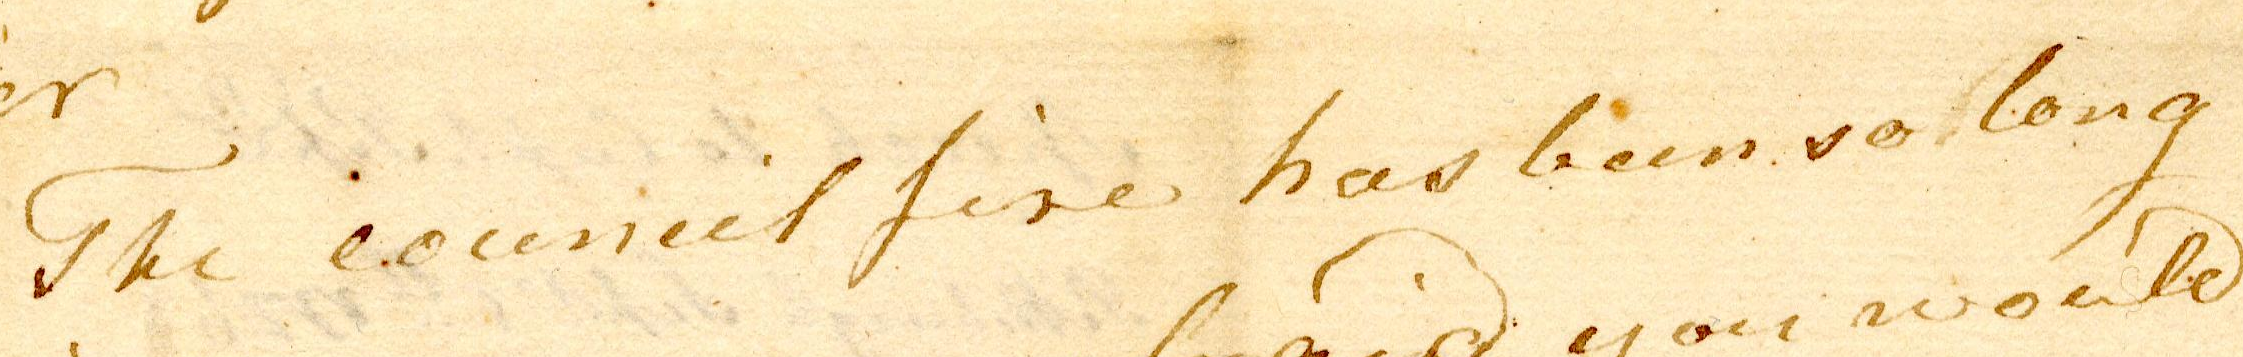The council fire has been so long
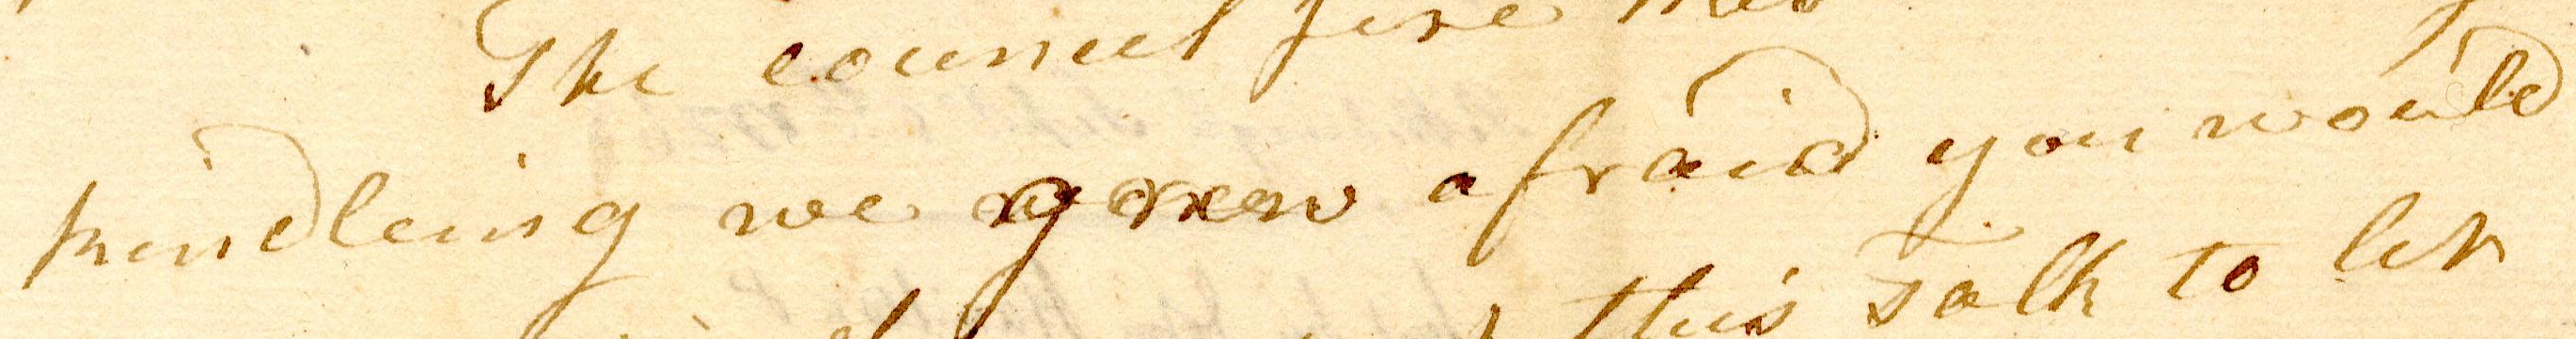kindling we grow afraid you would
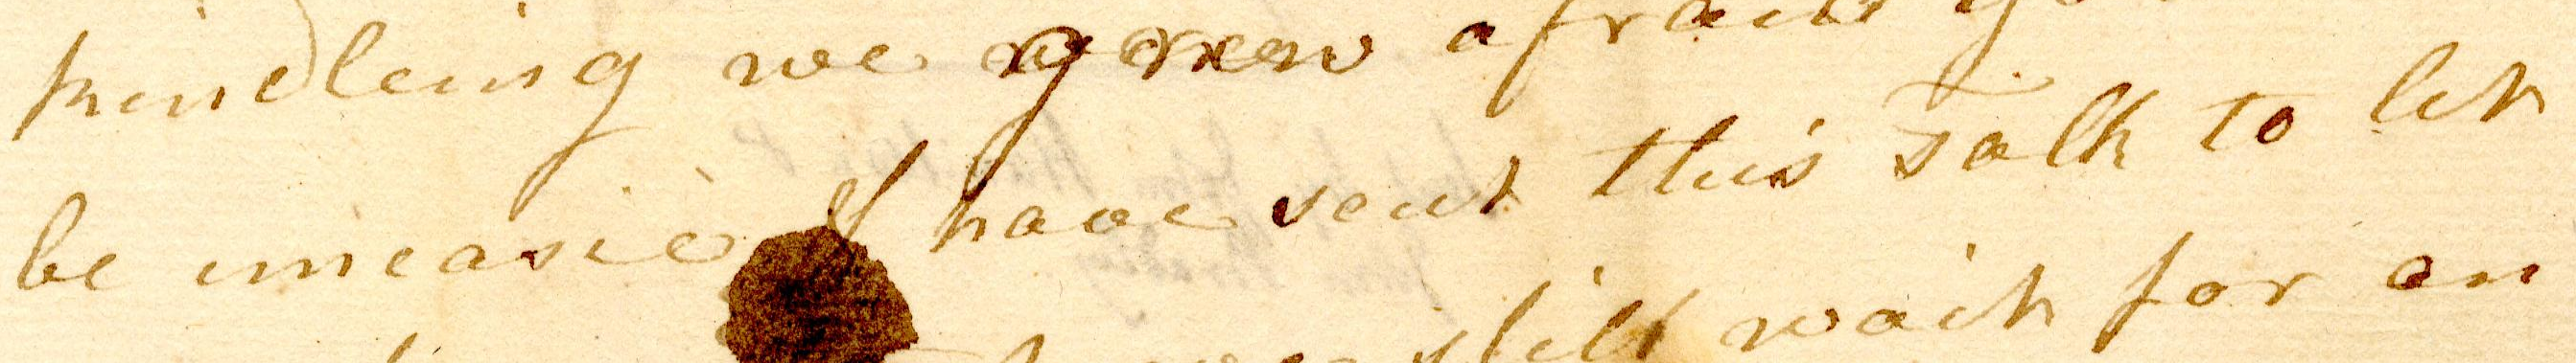be uneasie & have sout this Talk to let
